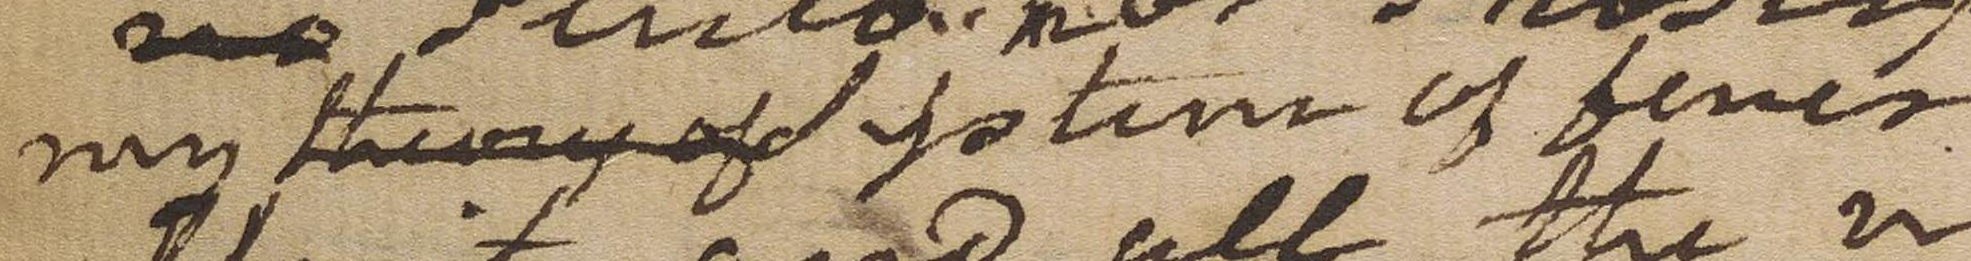my [theory of] system of fever
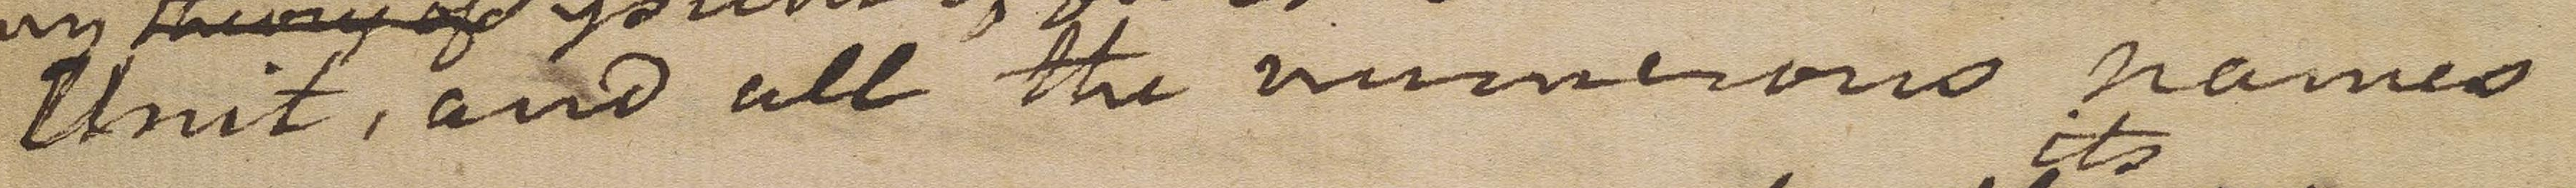Unit, and all the numerous names
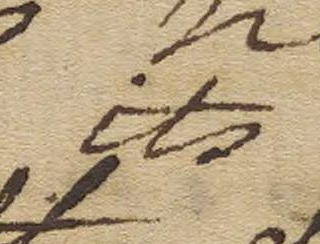its
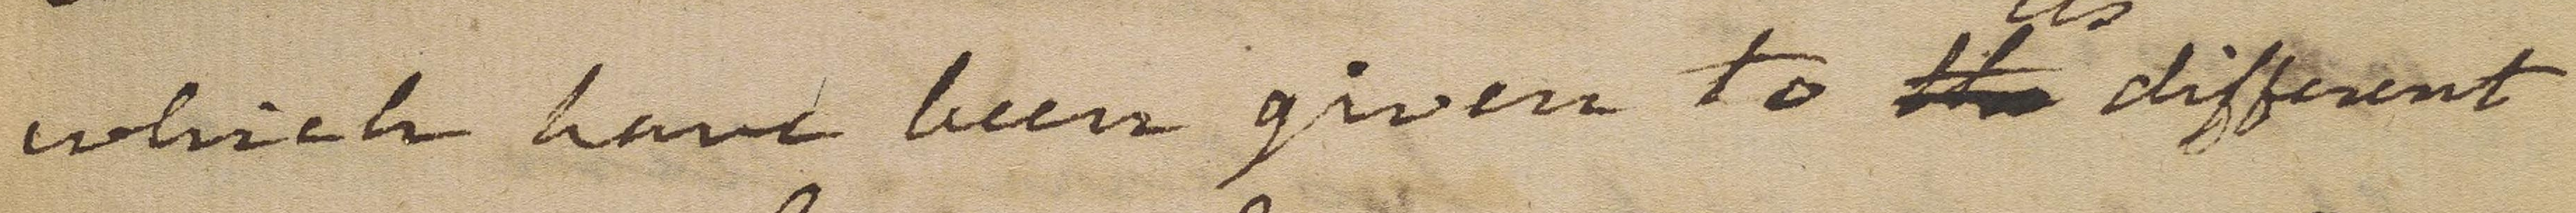which have been given to [the] different
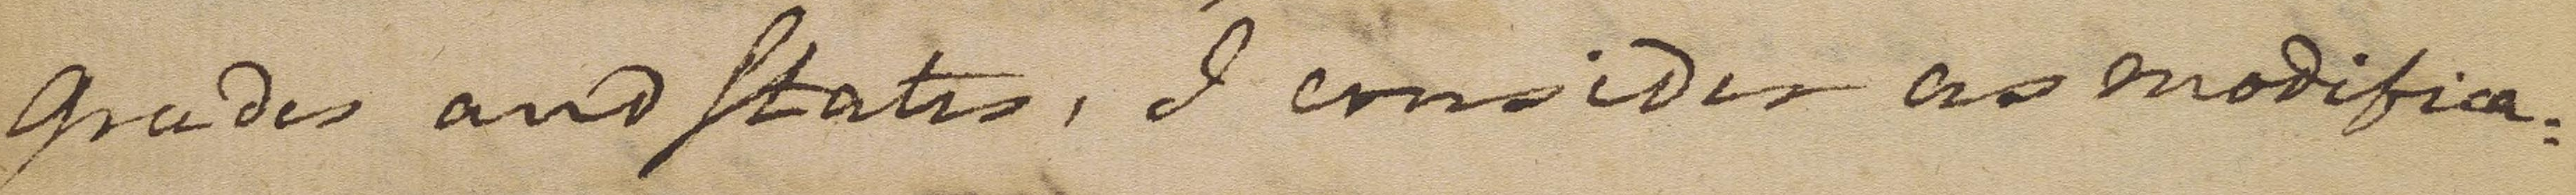grades and states, I consider as modifica-
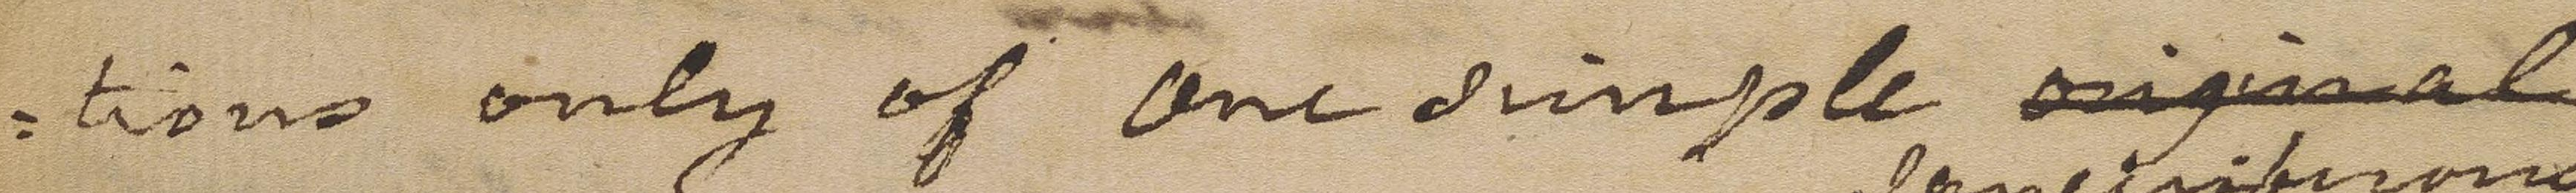-tions only of one simple [original]
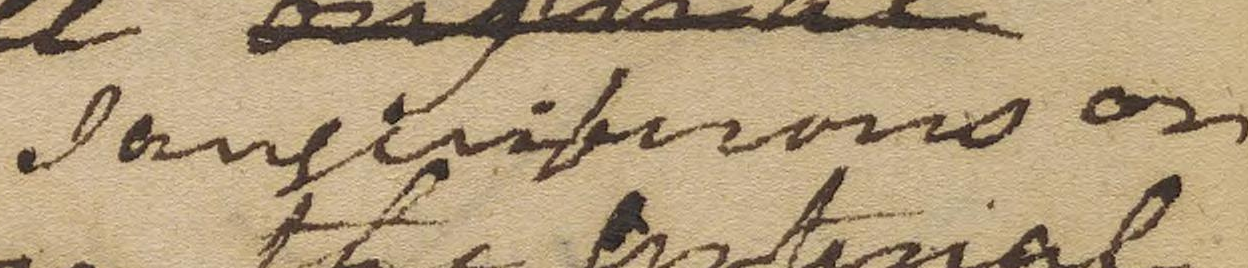sanguiferous or
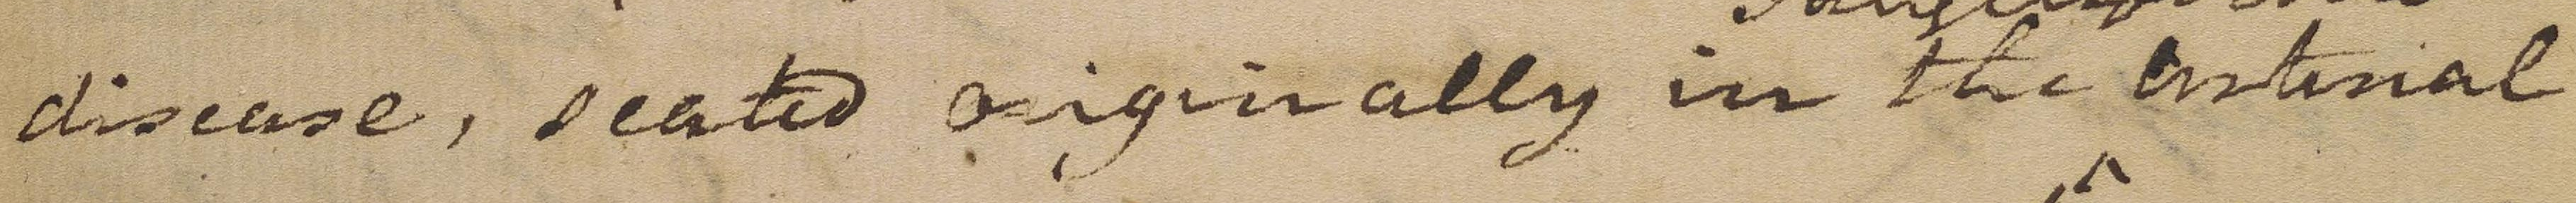diseases, seated originally in the ^ arterial
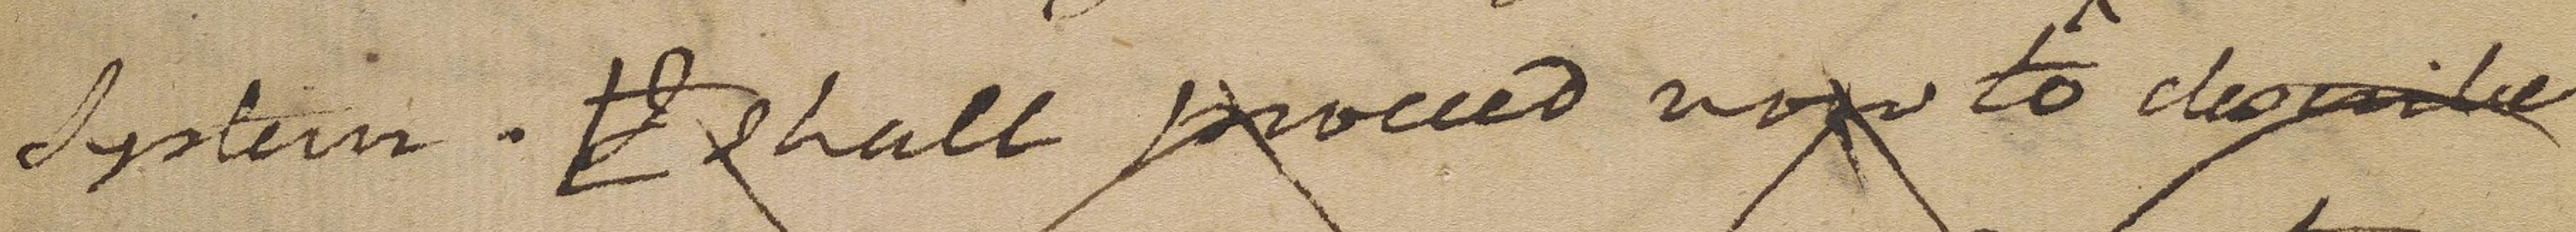system. (I shall proceed now to ^ describe
